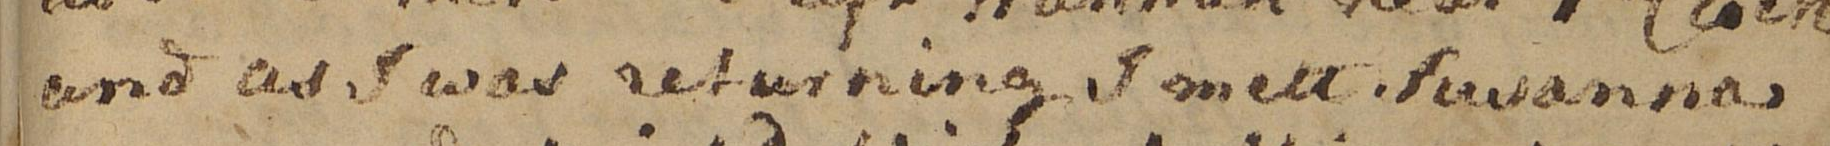and as I was returning, I mett Susanna
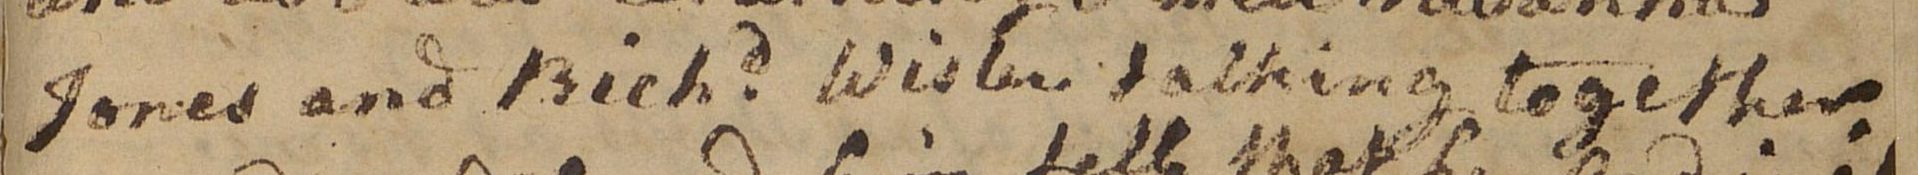Jones and Rich^d. Wister talking together
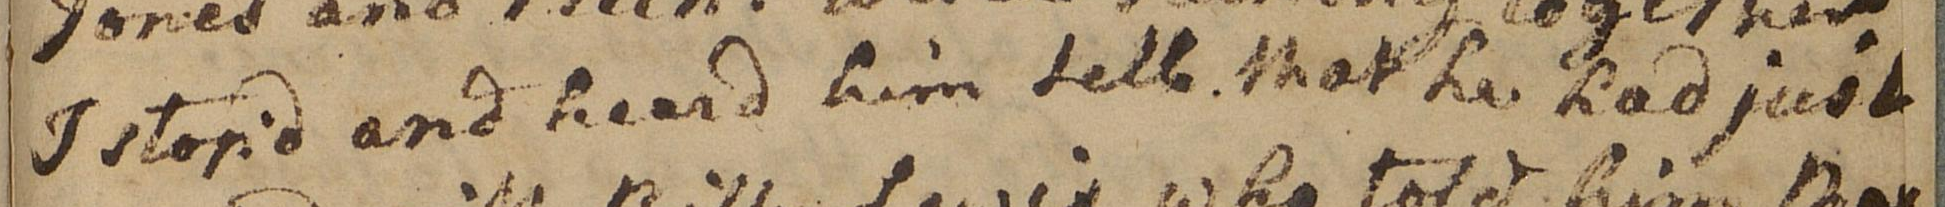I stop'd and heard him tell that has had just
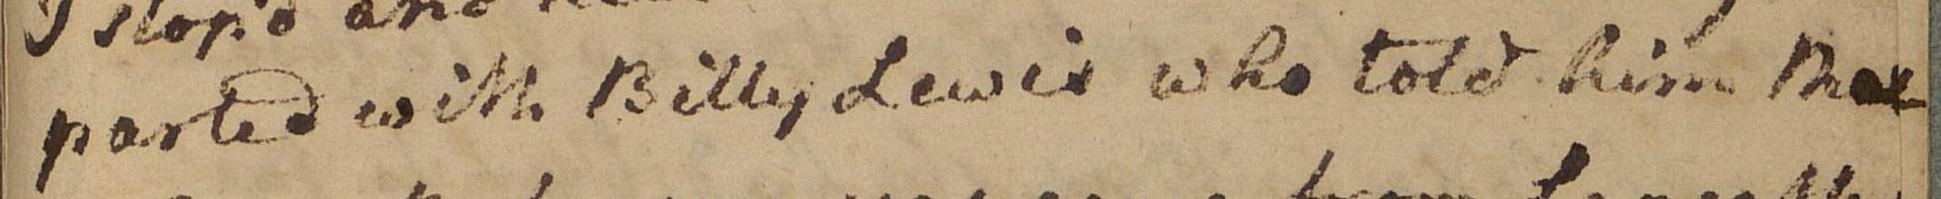parted with Billy Lewis who told him that
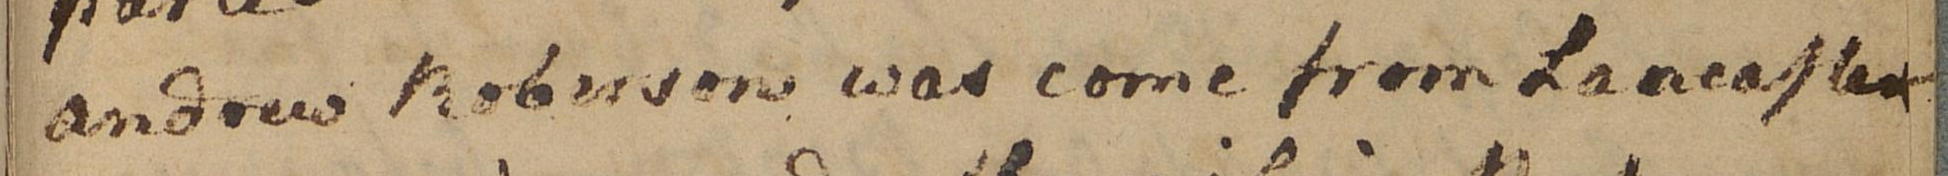Andrew Robersons was come from Lancaster
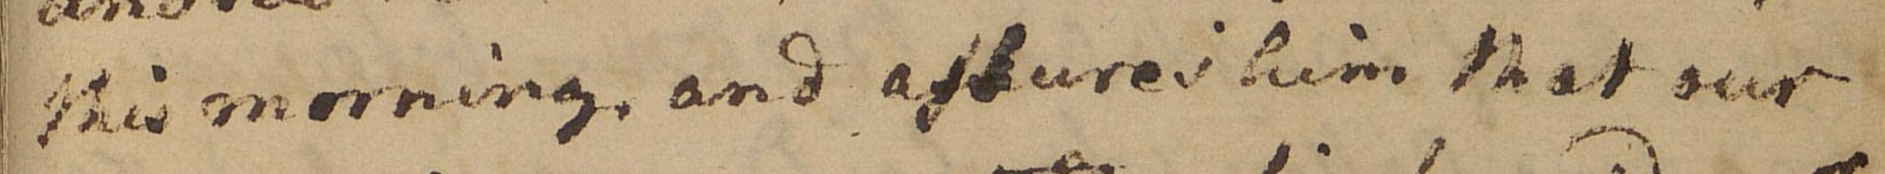this morning, and assures him that our
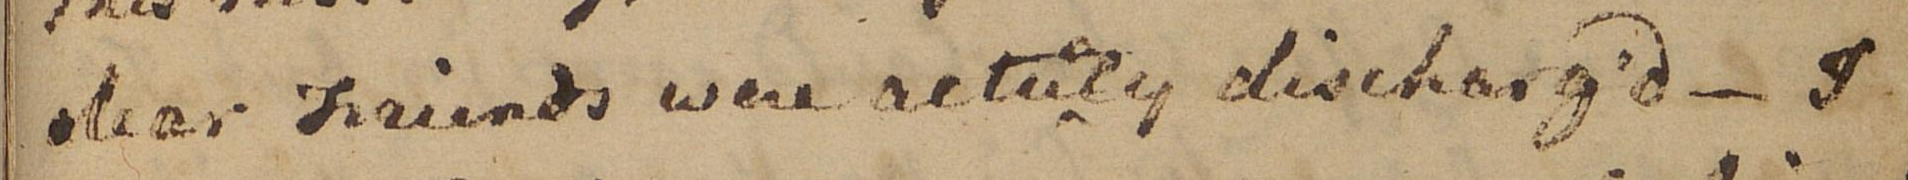dear Friends were actu^aly discharg'd- I
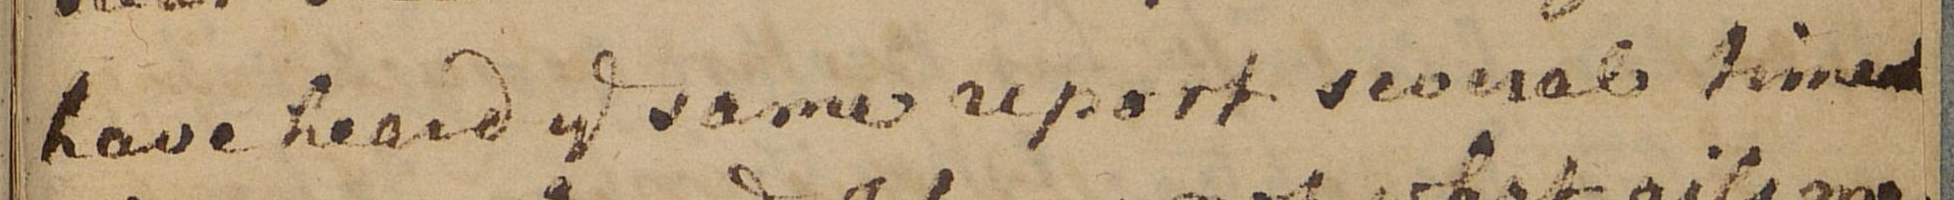have heard y^e same report several times
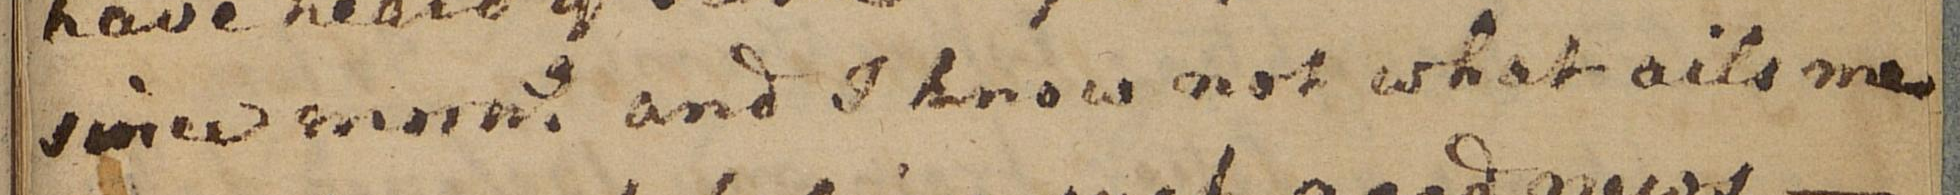since morn^g. and I know not what ails me
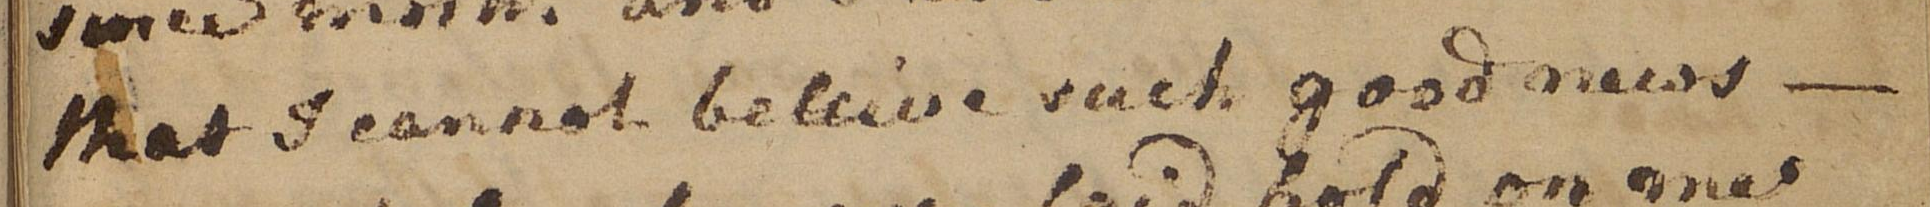that I cannot beleive such good news-
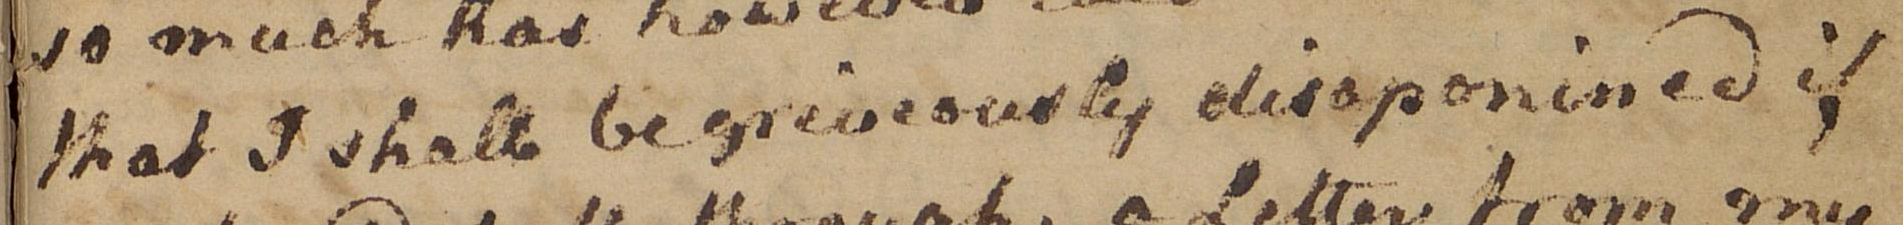that I shall be griveously disaponined if
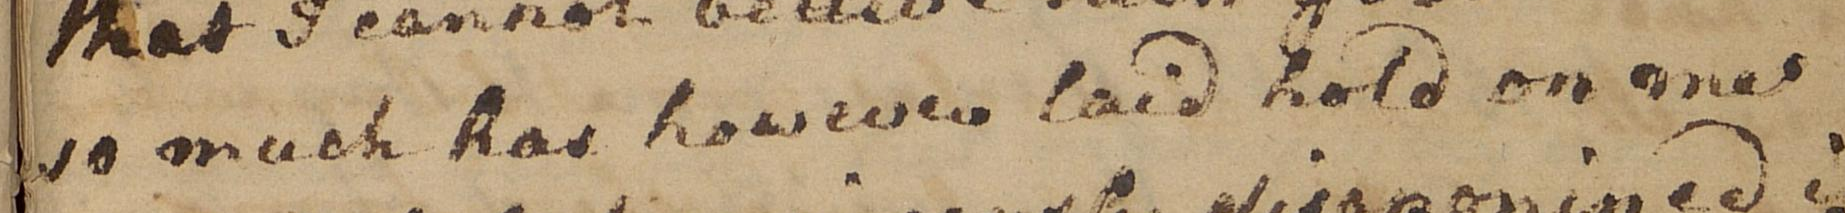so much has however laid hold on me
